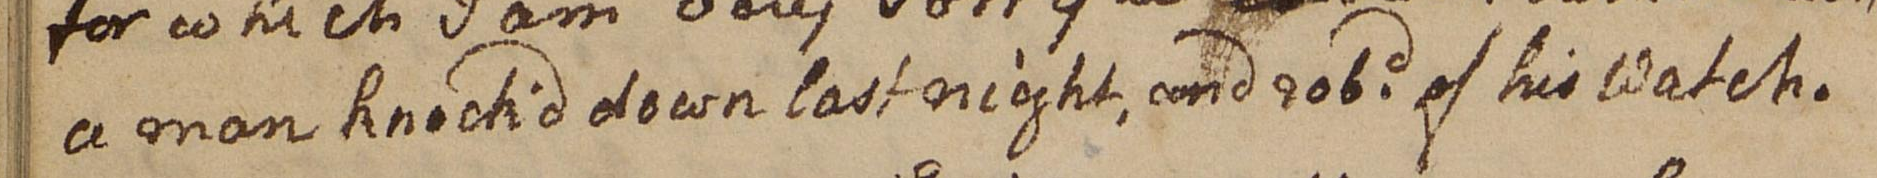a man knock'd down last night, and rob^d. of his Watch.
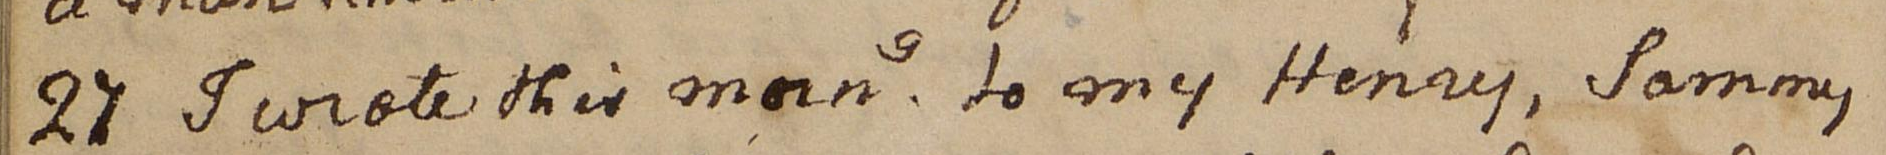27 I wrote this morn^g. to my Henry, Sammy
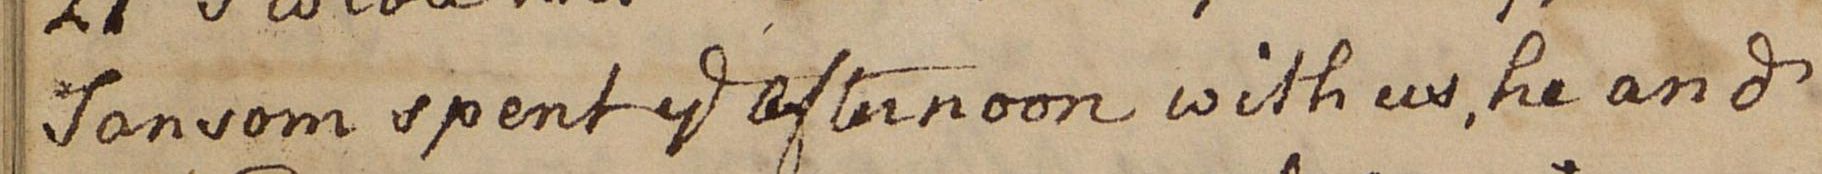Sansom spent y^e Afternoon with us, he and
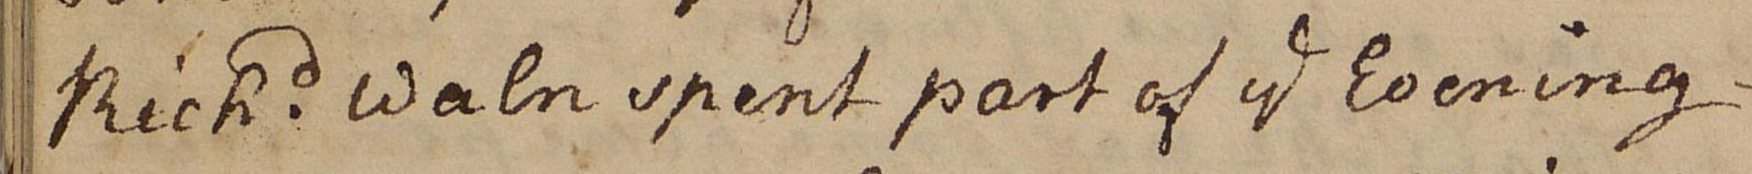Rich^d. Waln spent part of y^e Evening-
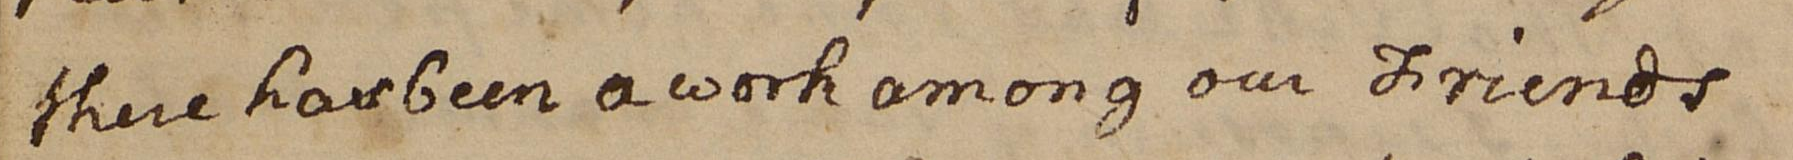there has been a work among our Friends
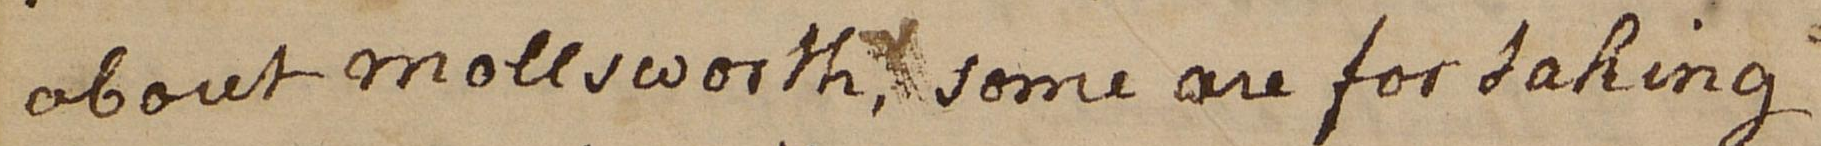about Mollsworth, some are for taking
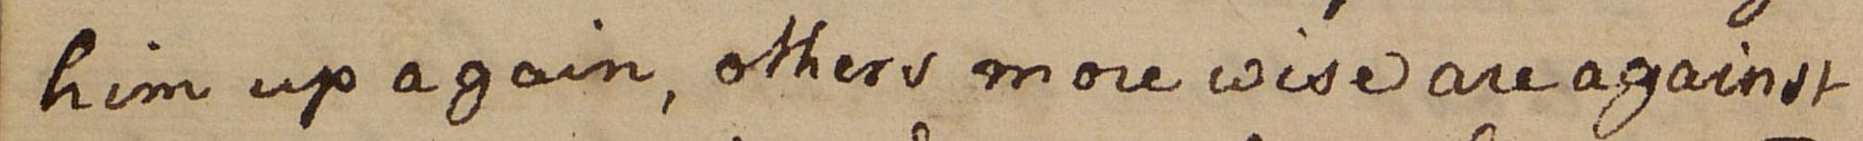him up again, others more wise are against
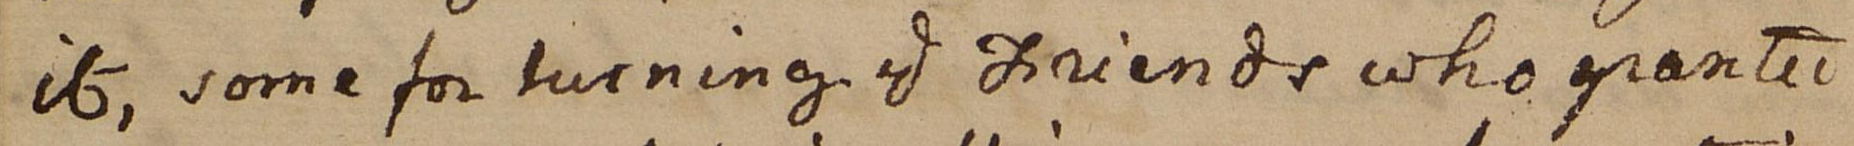it, some for turning y^e Friends who granted
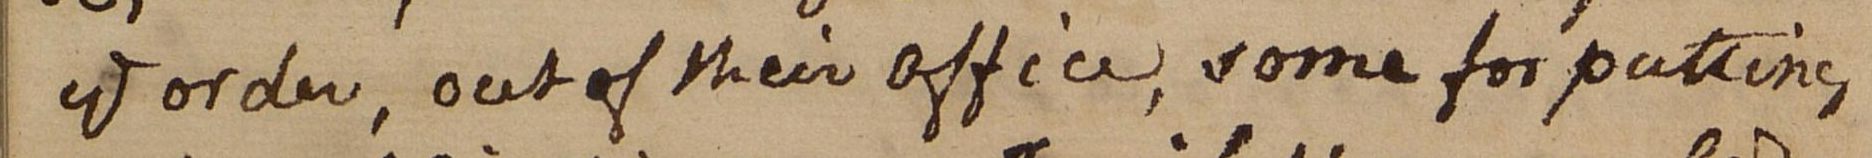y^e order, out of their office, some for putting
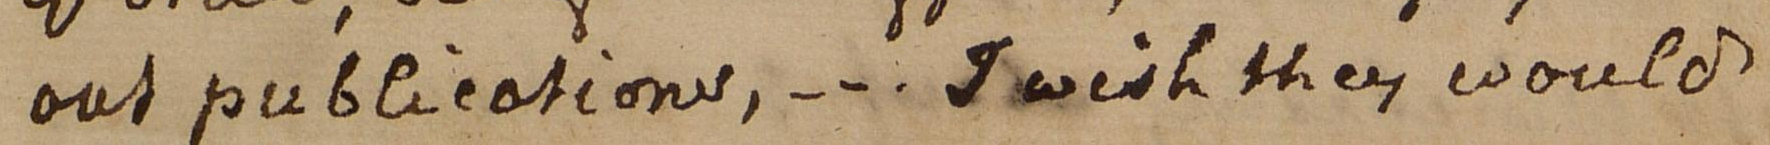out publications,-- I wish they would
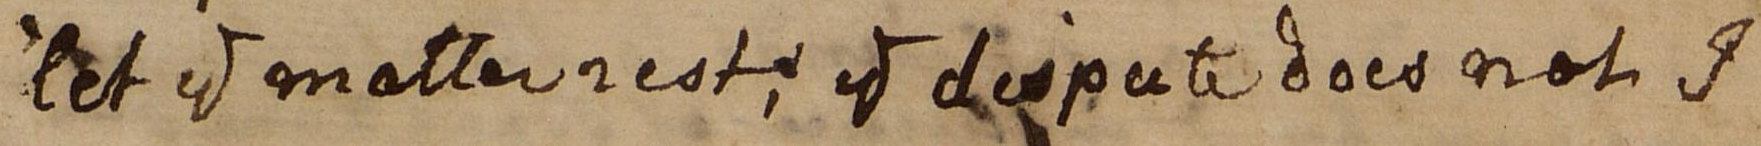let y^e matter rest; y^e dispute does not I
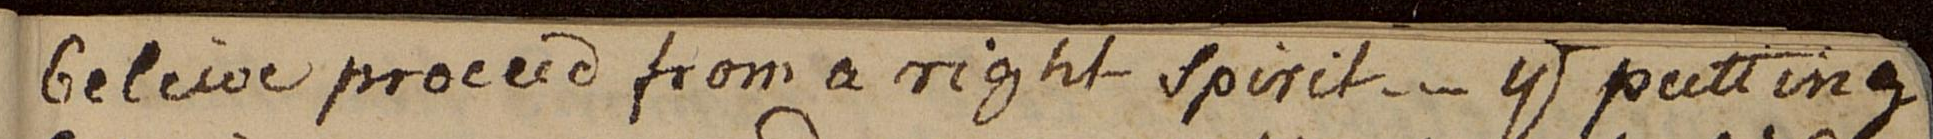beleive proceed from a right Spirit- y^e putting
